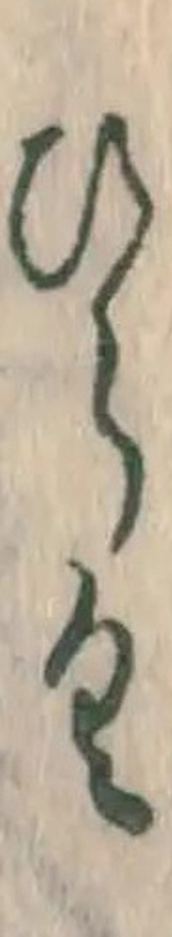ひらく

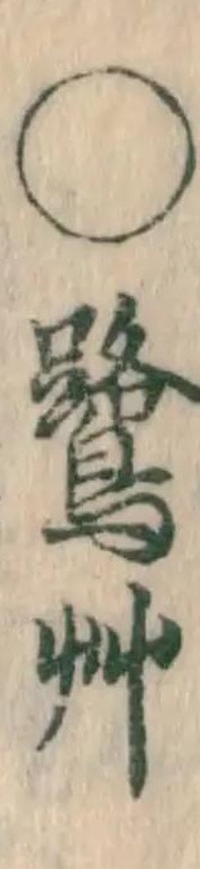〇鷺艸
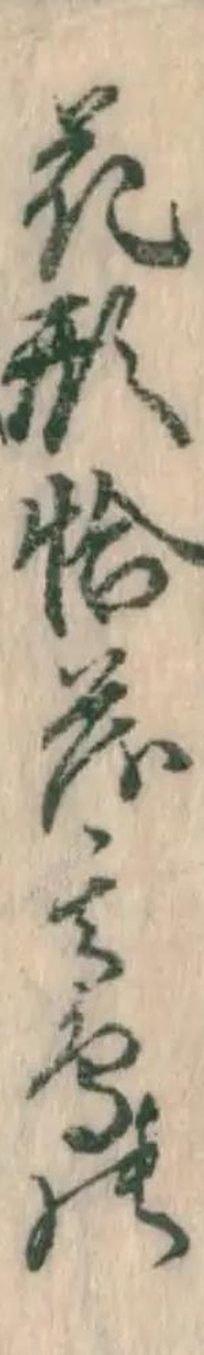花形恰も其鳥の
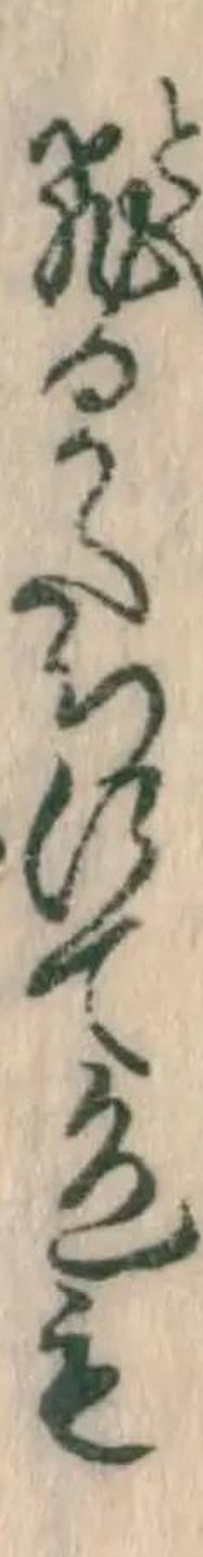飛るかたちにて色も
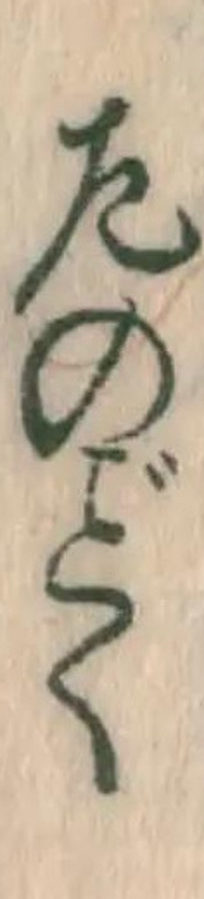左のごとく
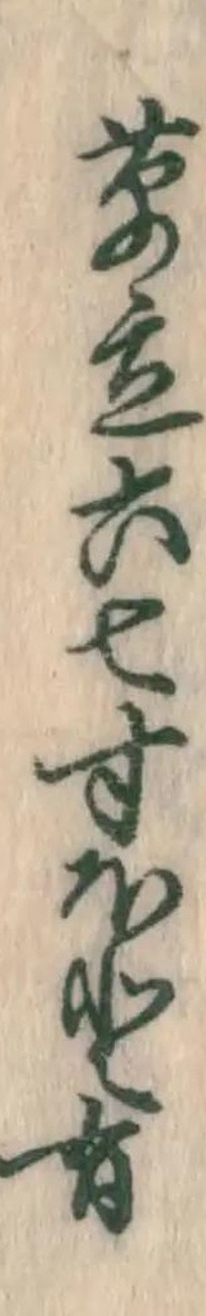草立六七寸ほと有
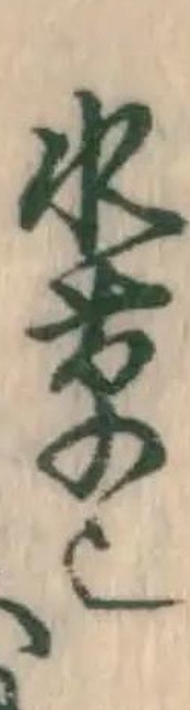水草也
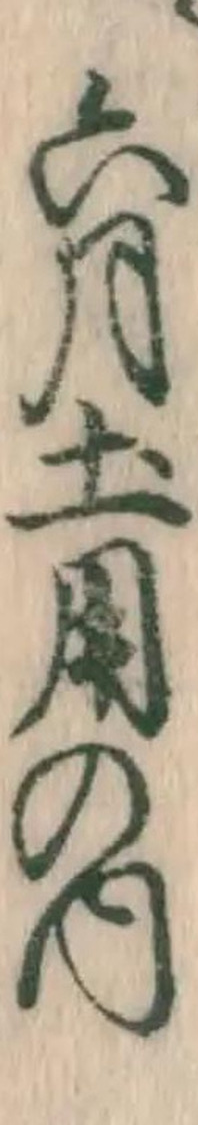六月土用の内
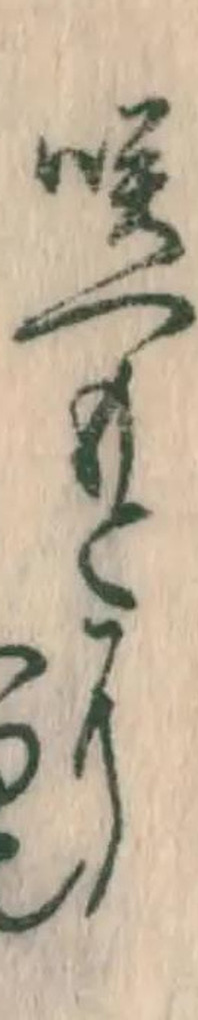咲一もとに
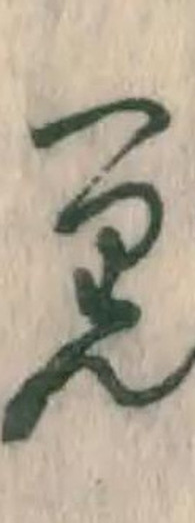一りん
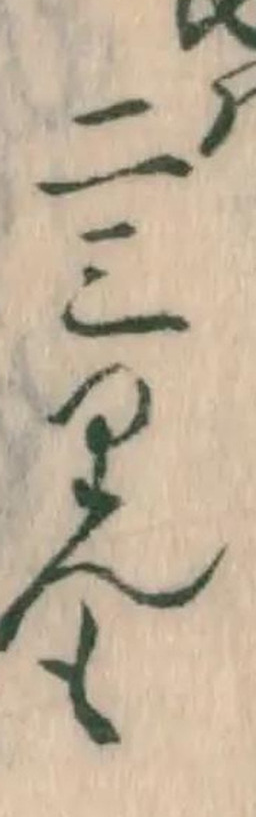二三りんも
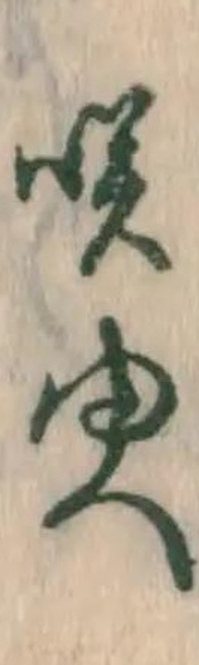咲ゆへ
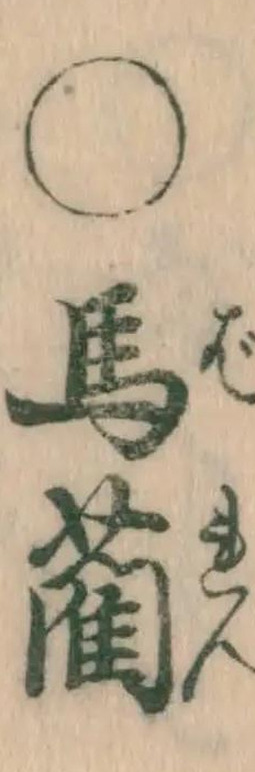〇馬藺
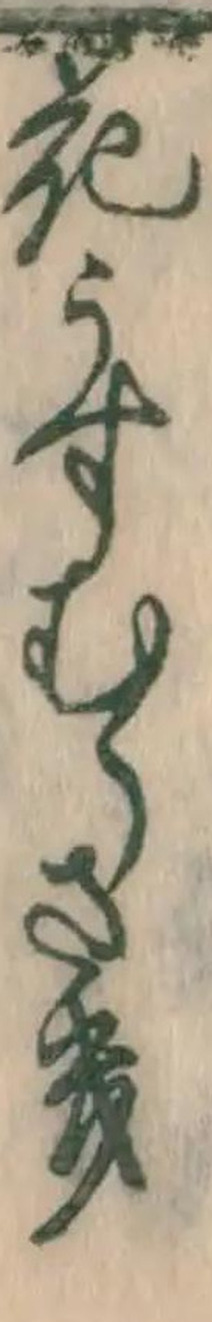花うすむらさき
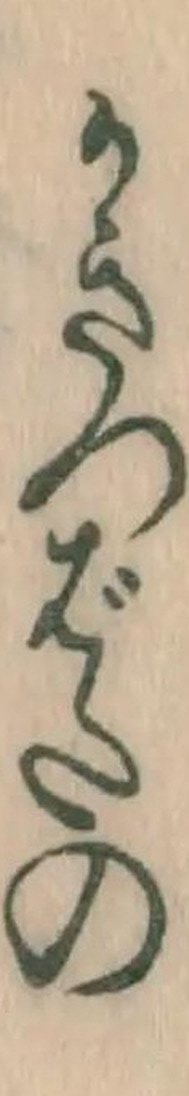かきつばたの
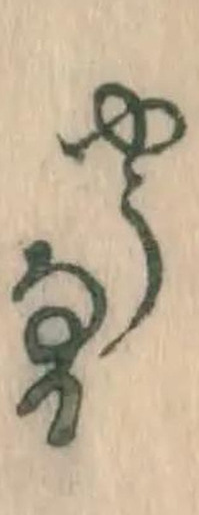やうなる
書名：艸花繪前集. [1]
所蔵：国立国会図書館 National Diet Library, JAPAN
